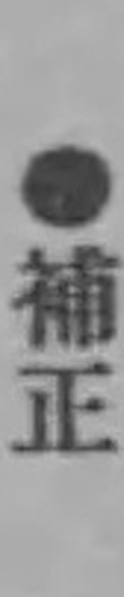●補正
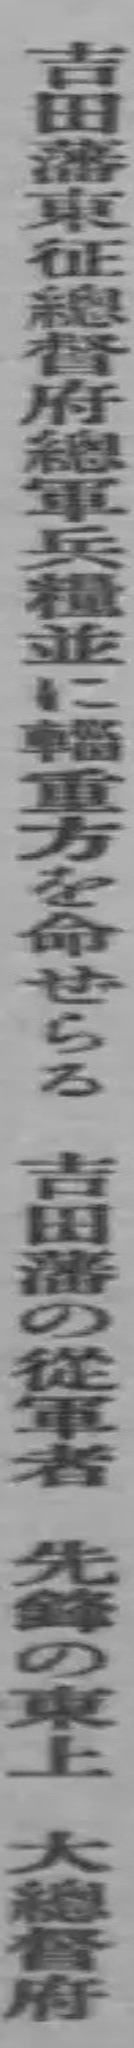吉田藩東征総督府総軍兵糧並に輺重方を命ぜらる吉田藩の従軍者先鋒の東上大総督府
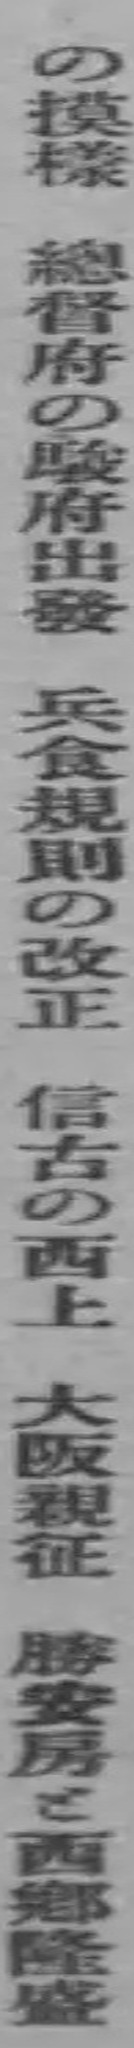の模様総督府の駿府出発兵食規則の改正信古の西上大阪親征勝安房と西郷隆盛
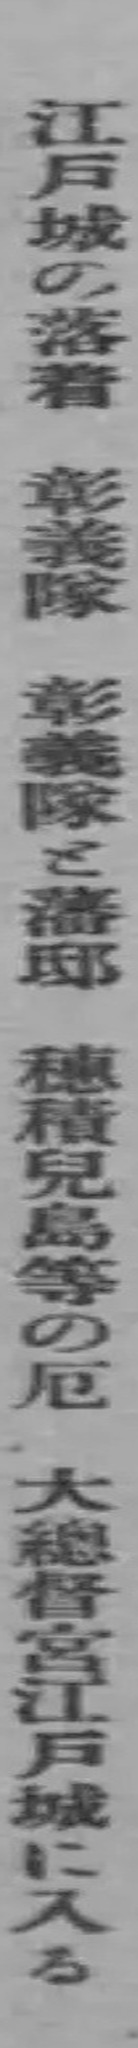江戸城の落着彰義隊彰義隊と藩邸穂積児島等の厄大総督宮江戸城に入る
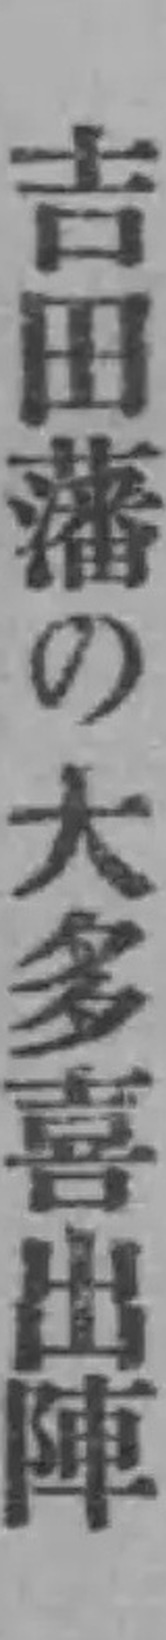吉田藩の大多喜出陣
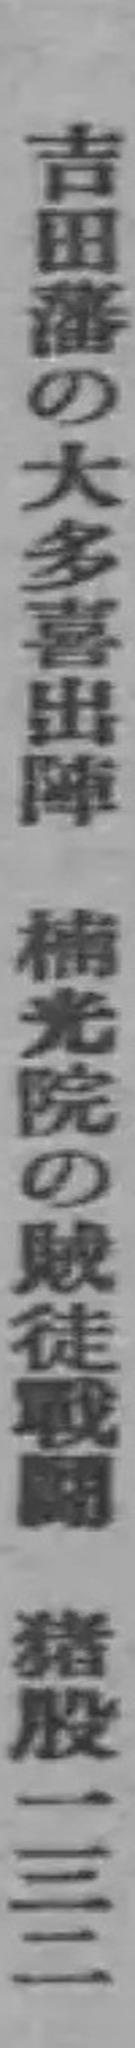吉田藩の大多喜出陣楠光院の賊徒戦闘猪俣一二三
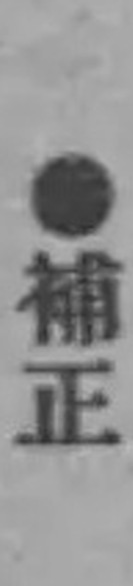●補正
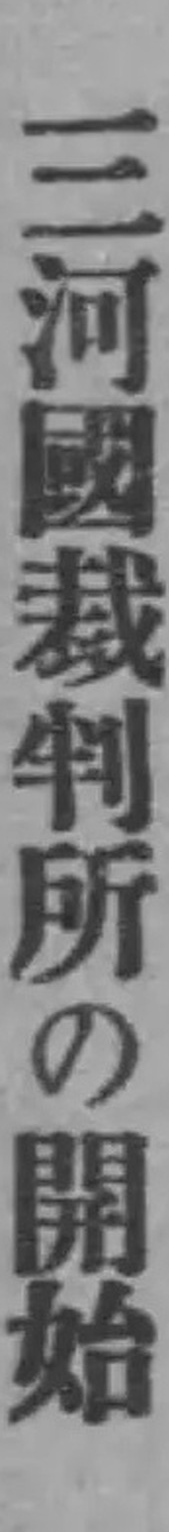三河国裁判所の開始
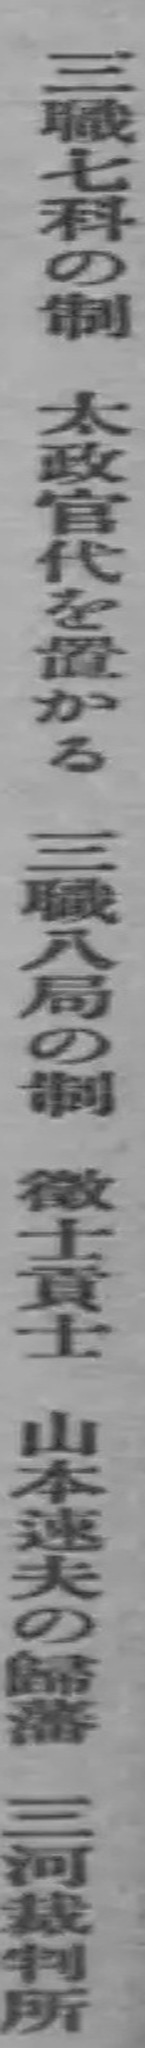三職七科の制太政官代を置かる三職八局の制徴士貢士山本速夫の帰藩三河裁判所
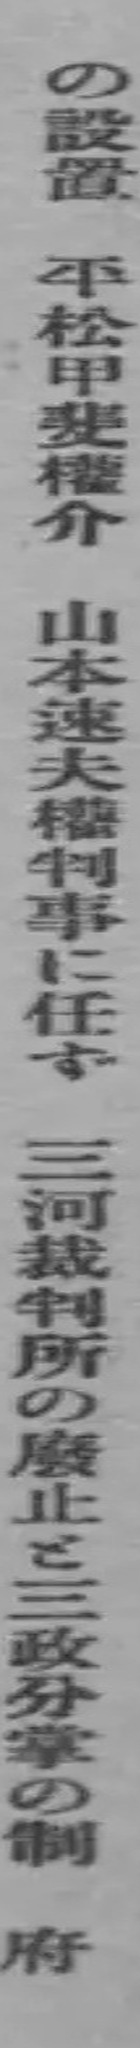の設置平松甲斐権介山本速夫権判事に任ず三河裁判所の廃止と三政分掌の制府
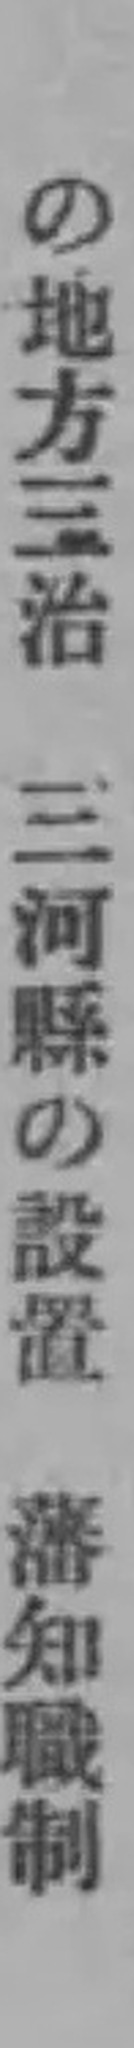の地方三治三河県の設置藩知職制
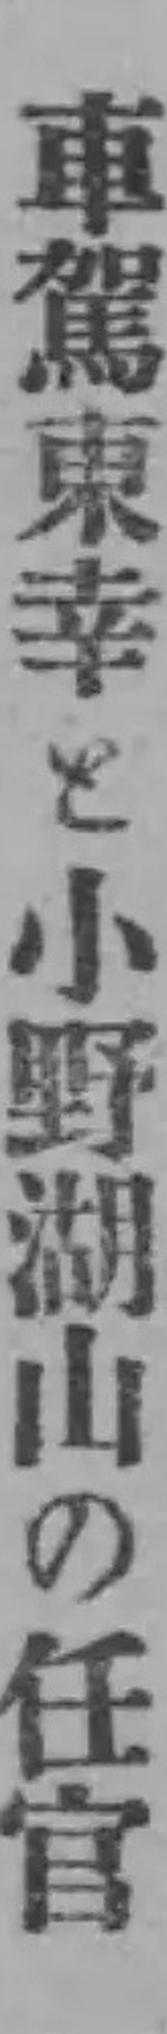車駕東幸と小野湖山の任官
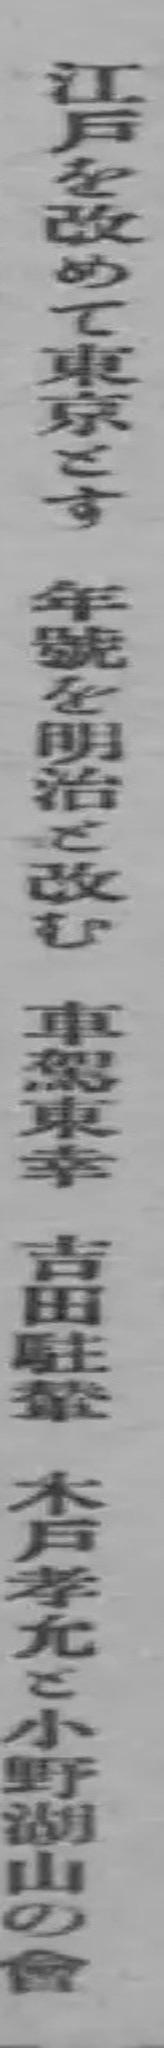江戸を改めて東京とす年号を明治と改む車駕東幸吉田駐輦木戸孝允と小野湖山の会
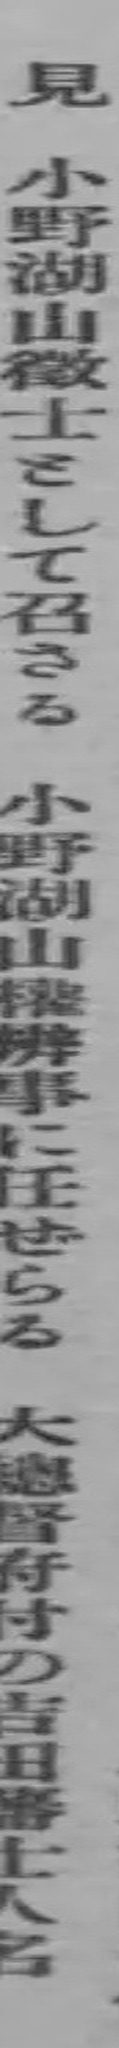見小野湖山徴士として召る小野湖山権弁事に任ぜらる大総督府付の吉田藩士人名
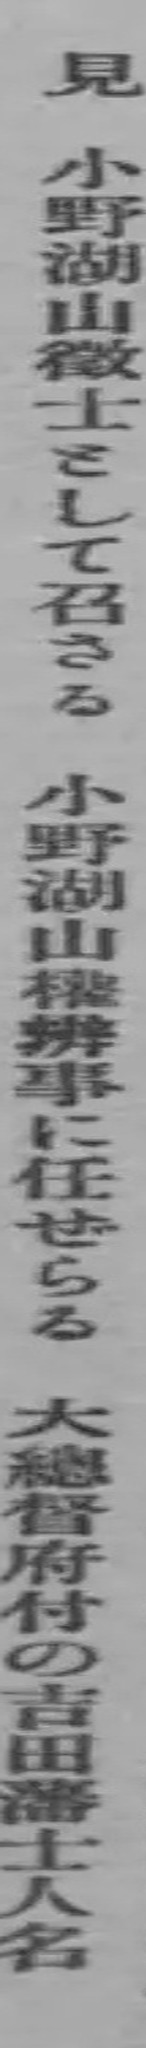見小野湖山徴士として召る小野湖山権弁事に任ぜらる大総督府付の吉田藩士人名
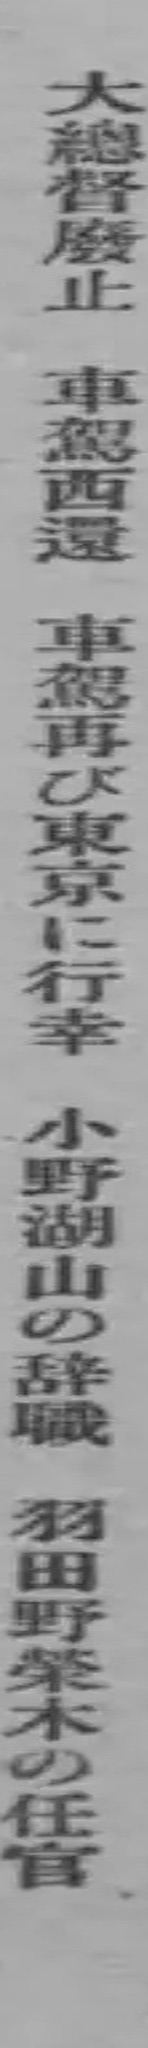大総督廃止車駕西還車駕再び東京に行幸小野湖山の辞職羽田野栄木の任官
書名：豊橋市史談
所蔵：国立国会図書館 National Diet Library, JAPAN
